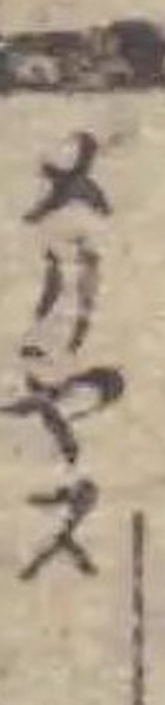メリヤス
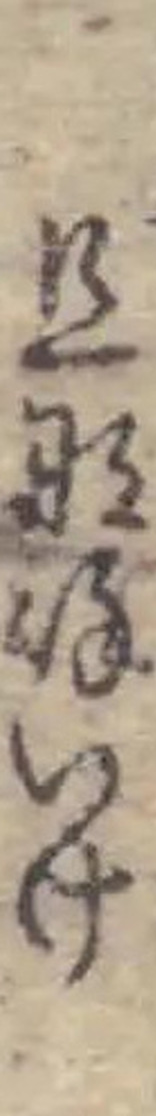旦那様いけ
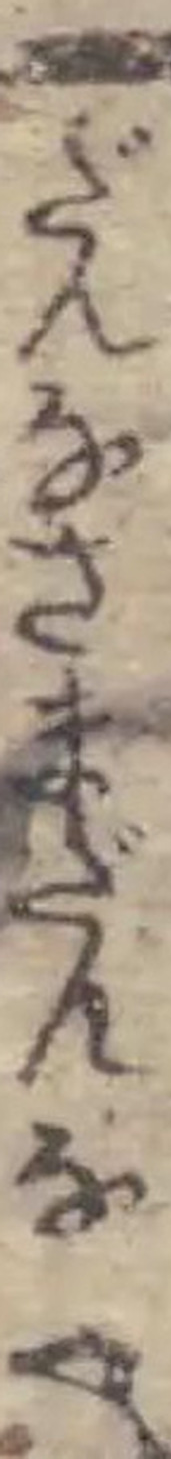だんなさまだんな
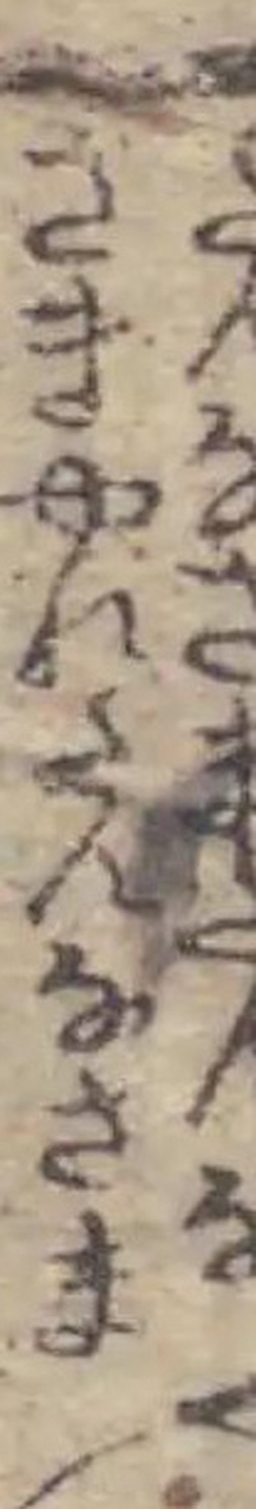さまやれだんなさま
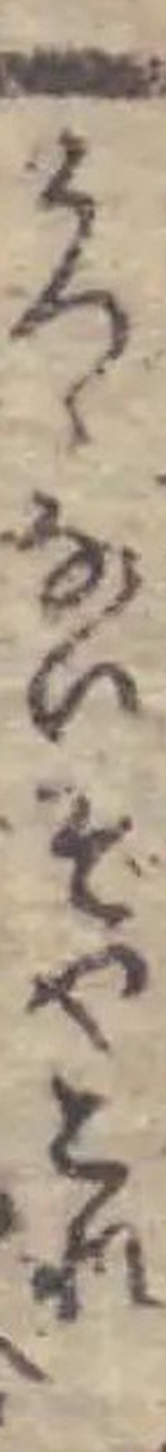うつゝないぞやこれ
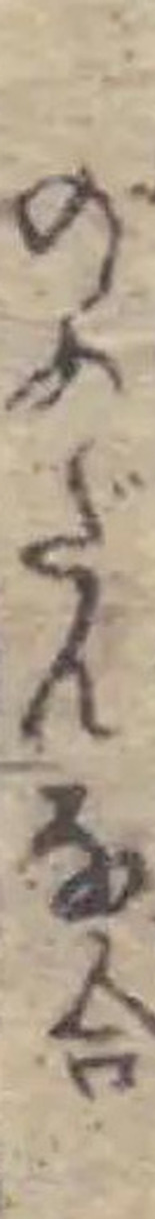のふだんな合
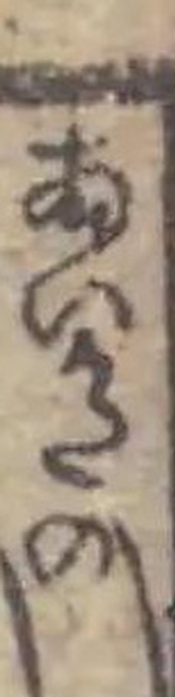あいかさの
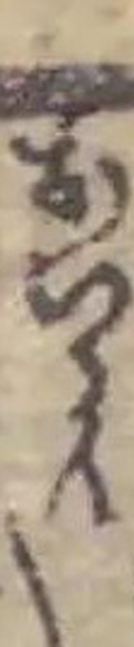おいらん
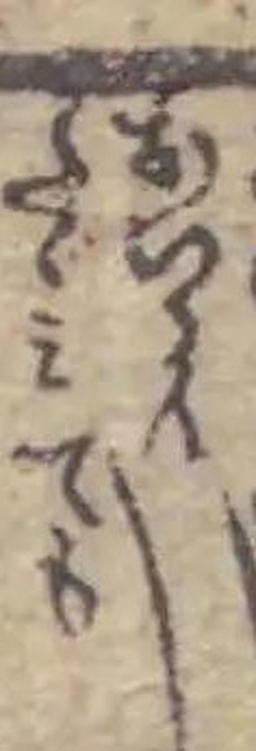たゝみても
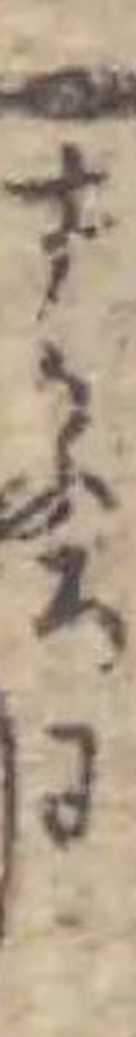ずかうろに
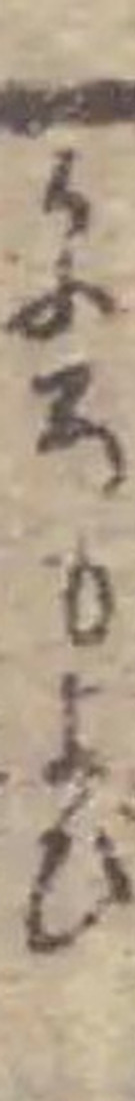かふろもよび
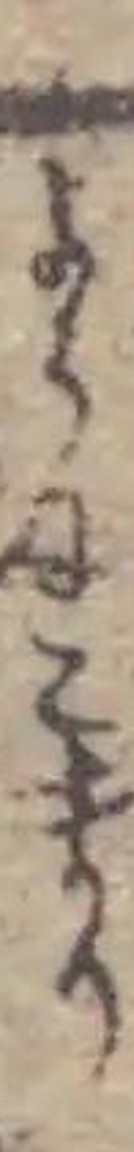ようにこまり
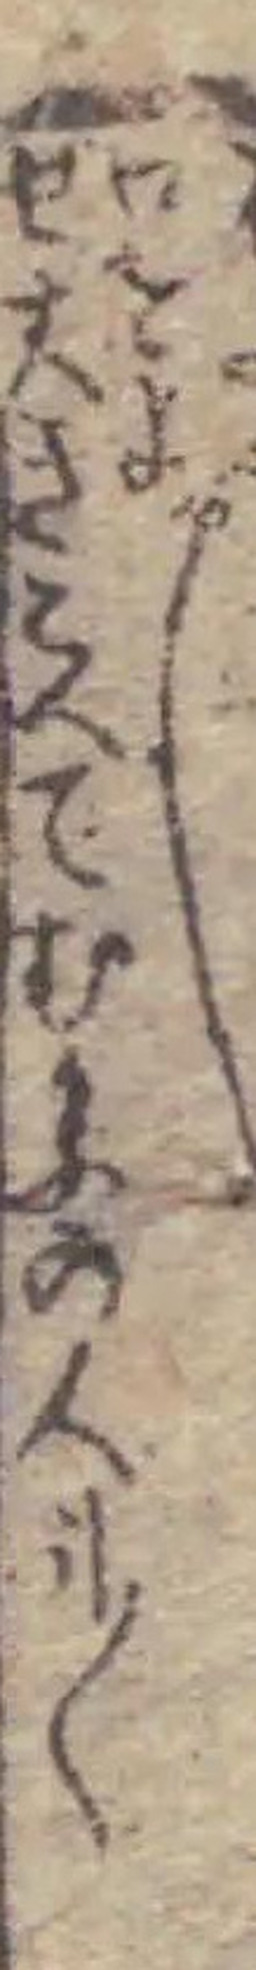せ大きこへてむかふの人〳〵
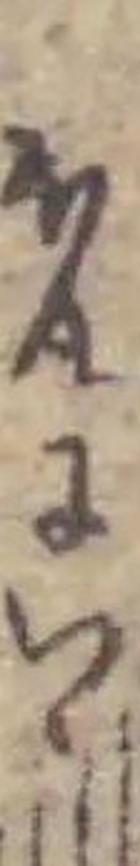ほんにいゝ
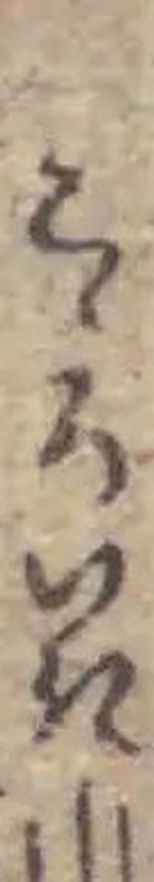こゝろいき
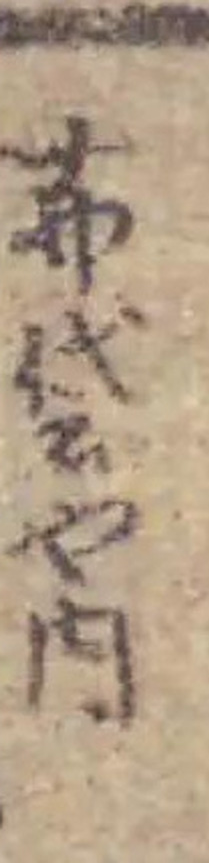布代云や内
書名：色男其処此処 3巻
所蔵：国立国会図書館 National Diet Library, JAPAN
